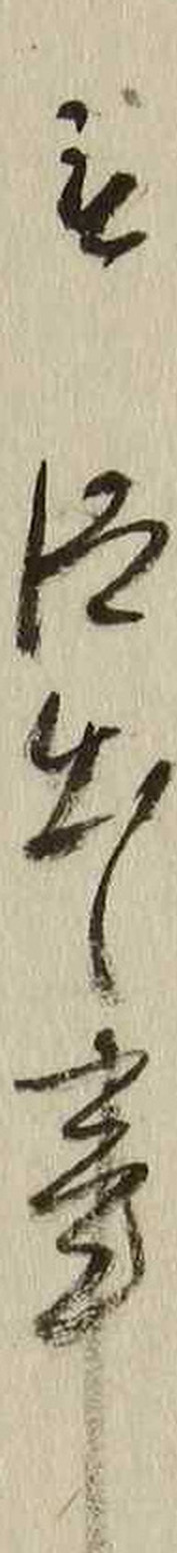被仰出候事
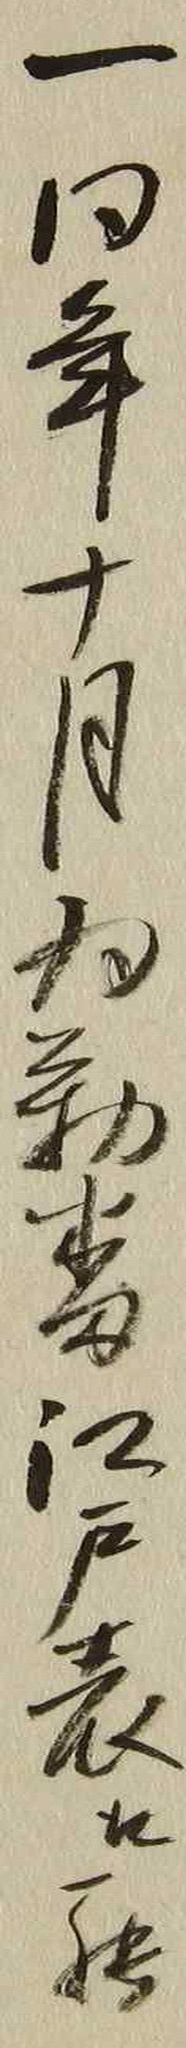一同年十月為勤番江戸表江罷
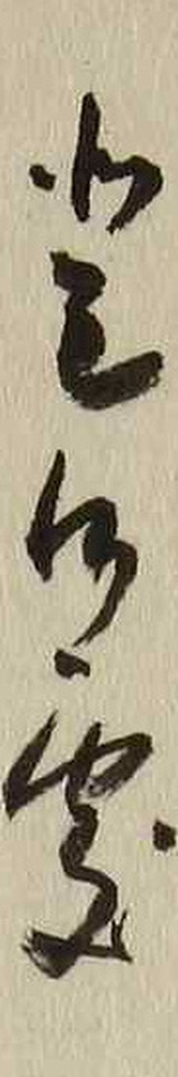登候処
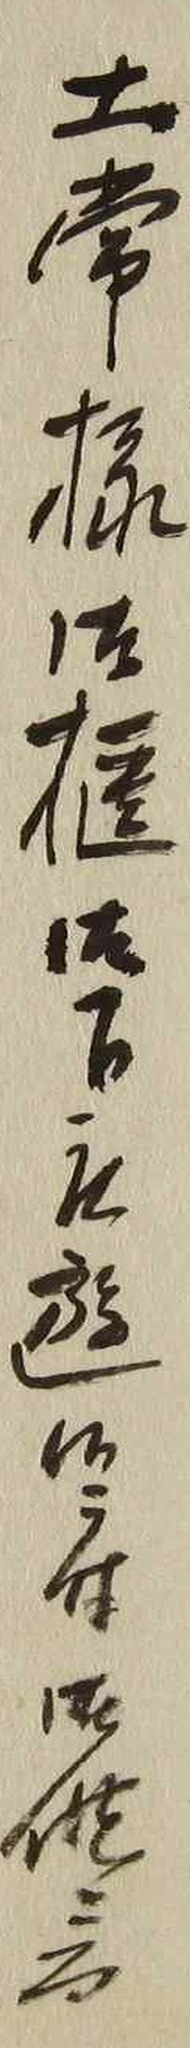土常様御櫃御下被遊候ニ付御供ニ而
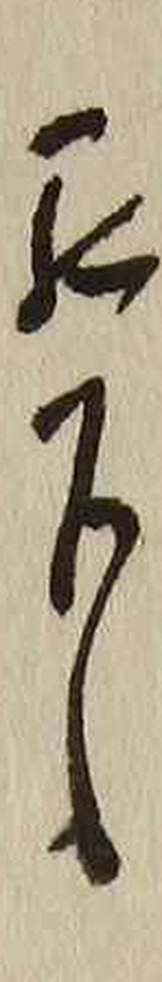罷下候
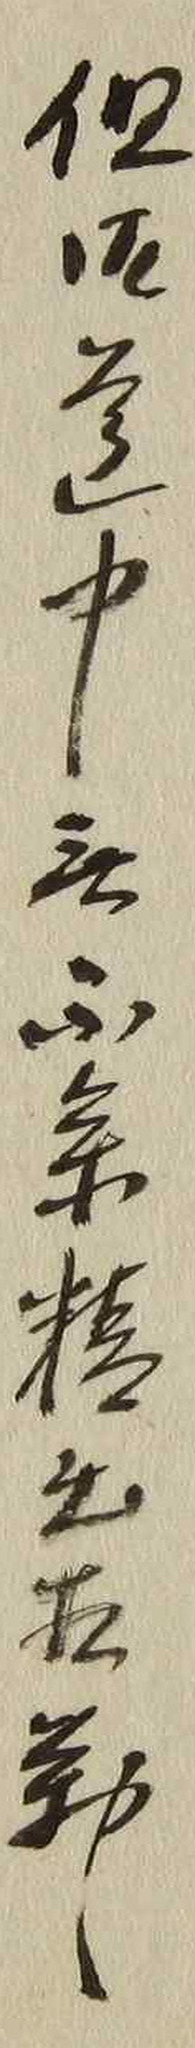但御道中無不参精出相勤候
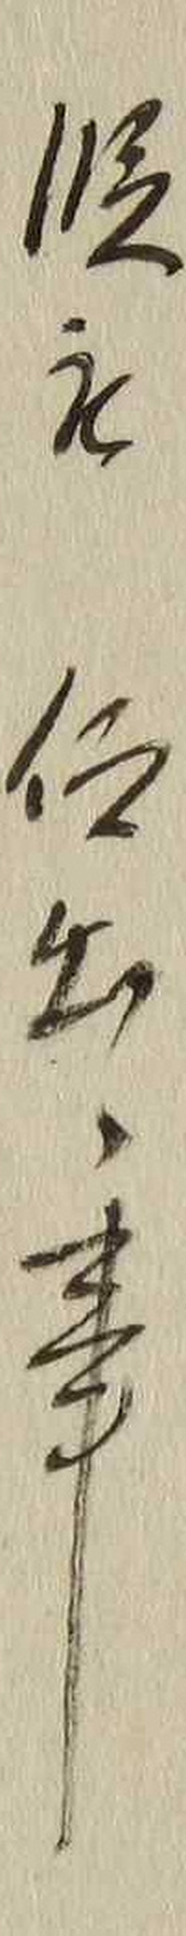段被仰出候事
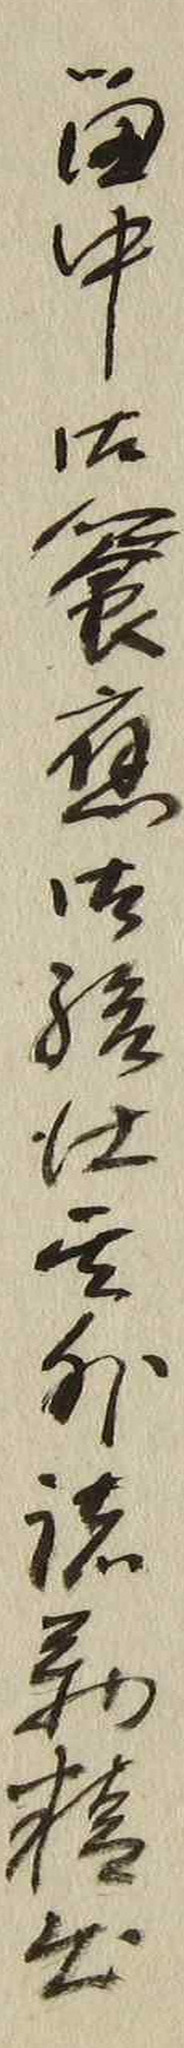留中御饗応御給仕其外諸勤精出
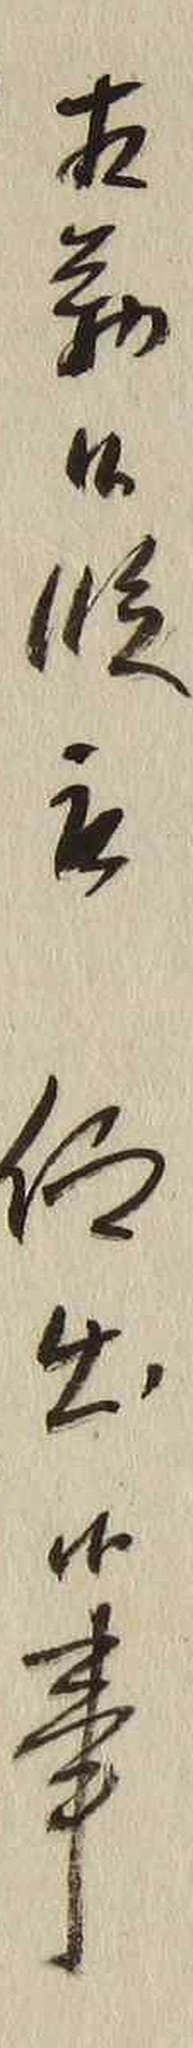相勤候段被仰出候事
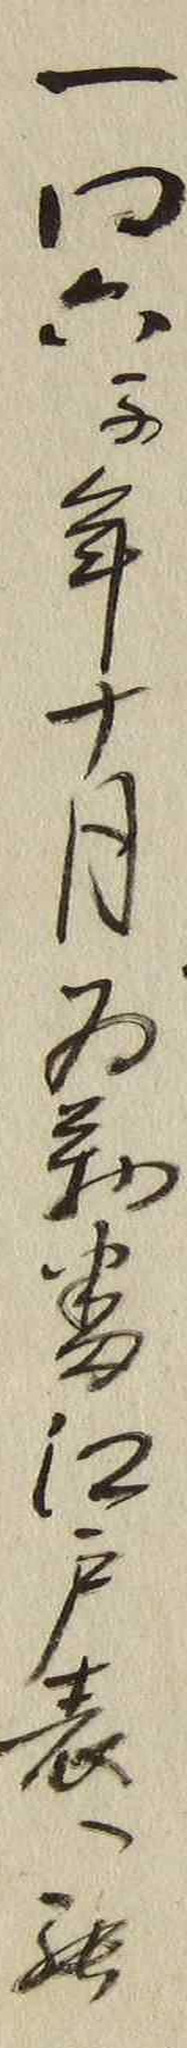一同六子年十月為勤番江戸表へ罷
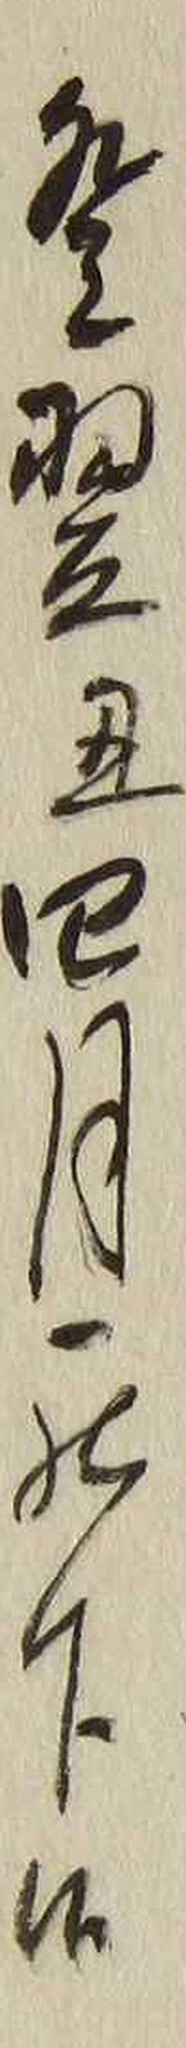登翌丑四月罷下候
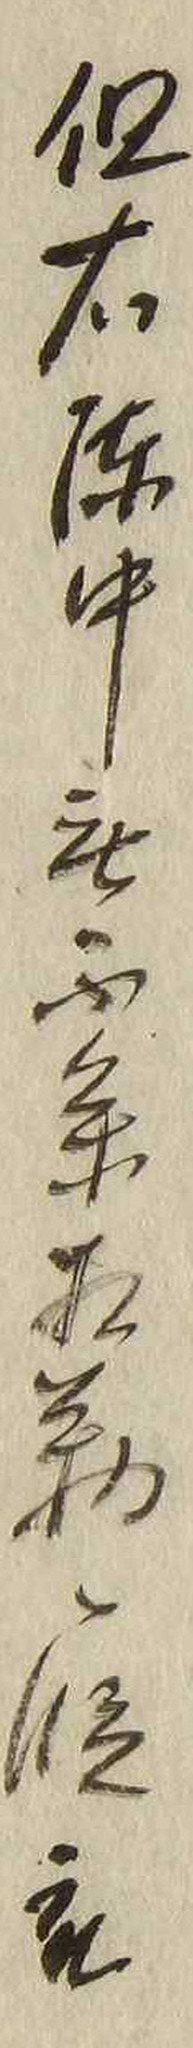但右陣中無不参相勤候段被

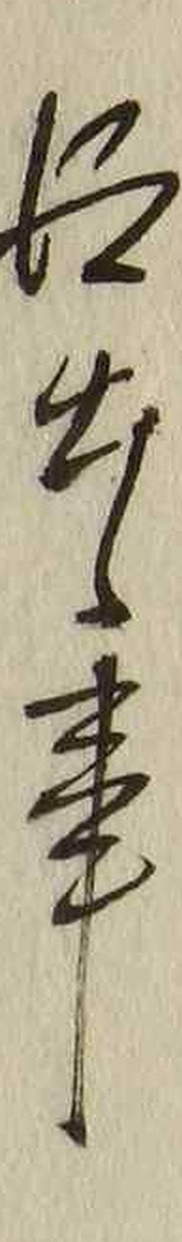仰出候事
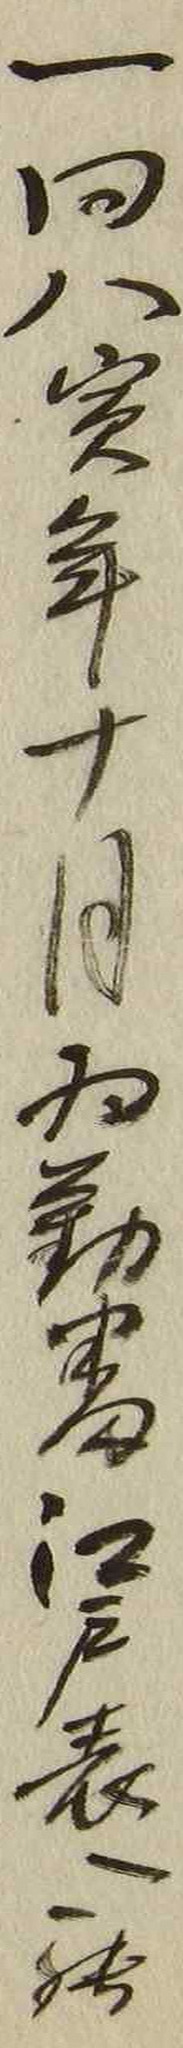一同八寅年十月為勤番江戸表へ罷
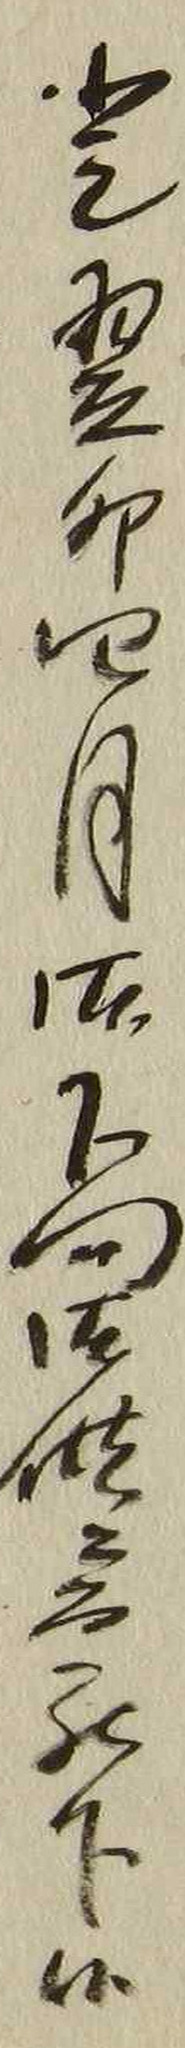登翌卯四月御下向御供ニ而罷下候
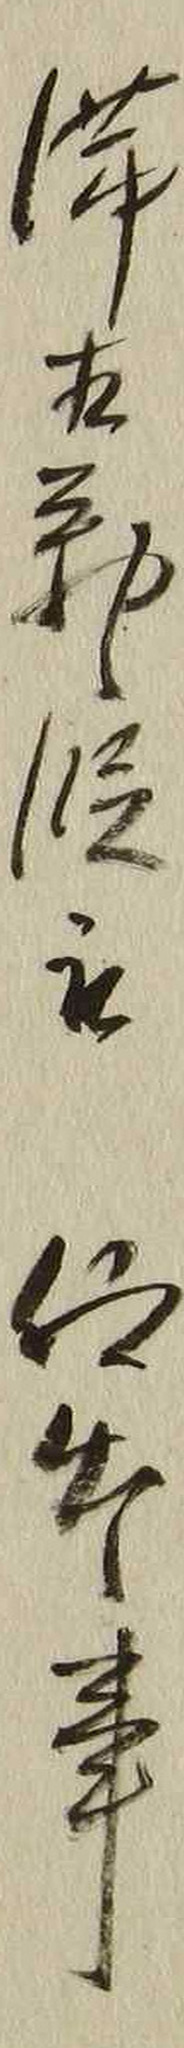滞相勤候段被仰出候事
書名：諸士系譜　巻之359　す之部9
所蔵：会津若松市立会津図書館
